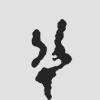兵
